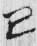己
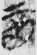梄（酉）
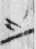之
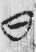日
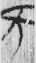不
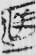𬨭（將）
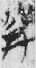登
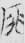厞
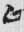㠯（以）
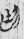○（廷）
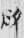阩
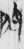門
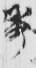秀
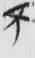不
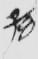孫
